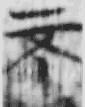不
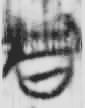同
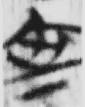室
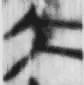大
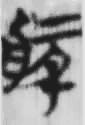痎
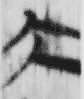大
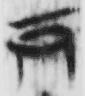尹
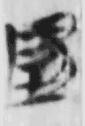○（陽）
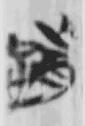鎆
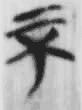不
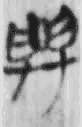與
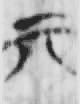亓（其）
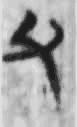父
